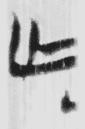亡
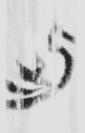此
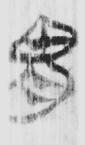胃
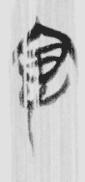{宀卑}
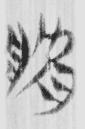{爿兔}
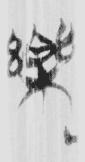樂
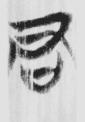君
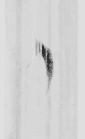人
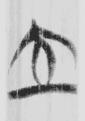立
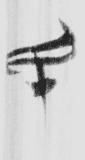民
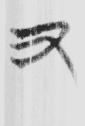又
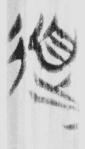道
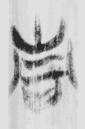青
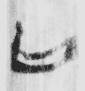㠯（以）
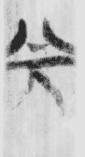{八万}
